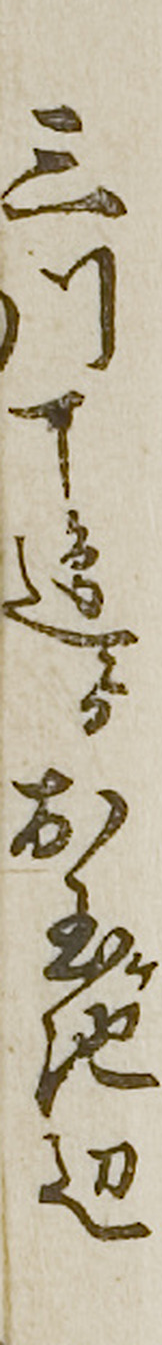三川丁辺よりお玉ケ池辺
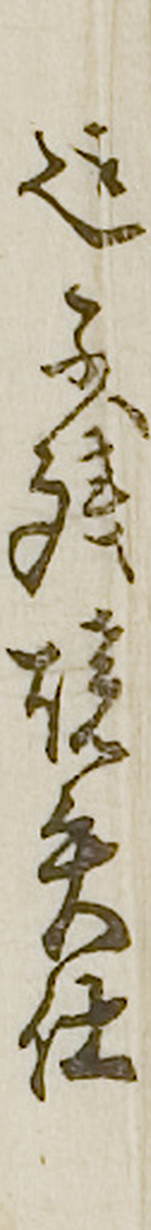迄不残焼失仕
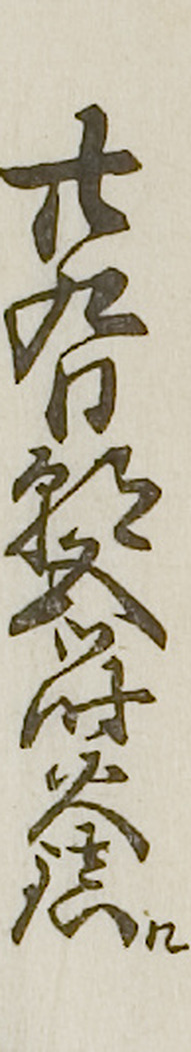二十九日朝五ツ時火鎮ル
